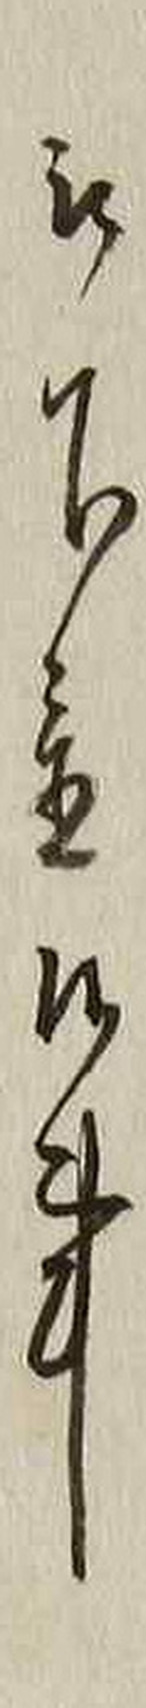被下置候事
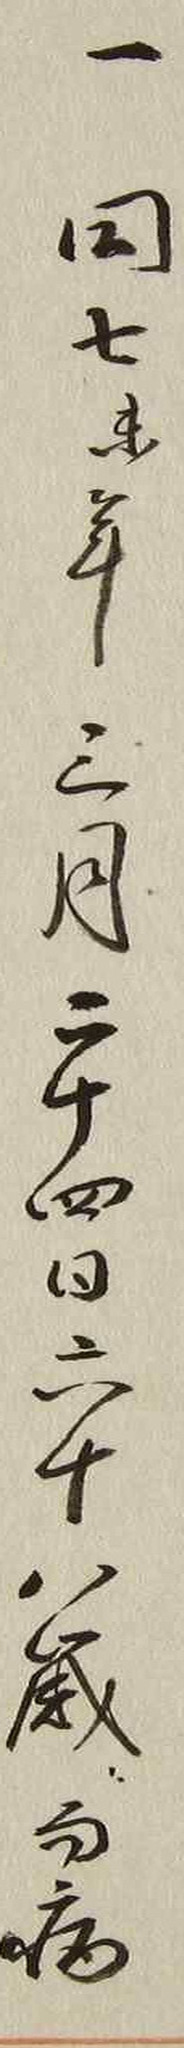一同七未年三月二十四日六十八歳に而病
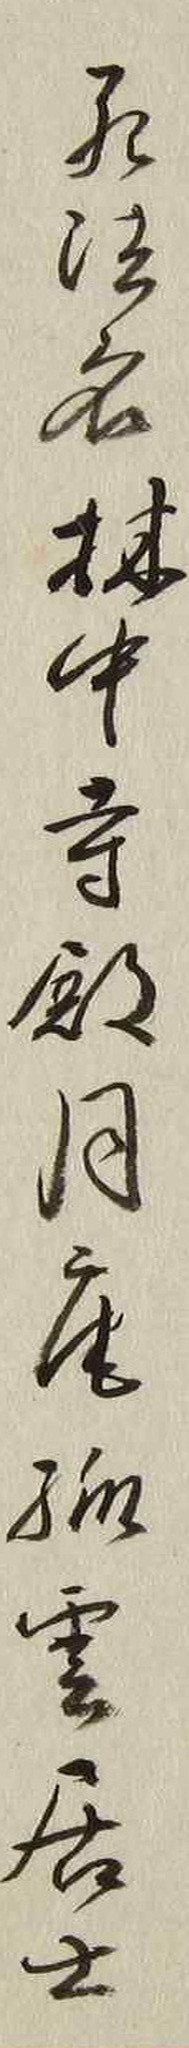死法名林中寺殿月座弧雲居士
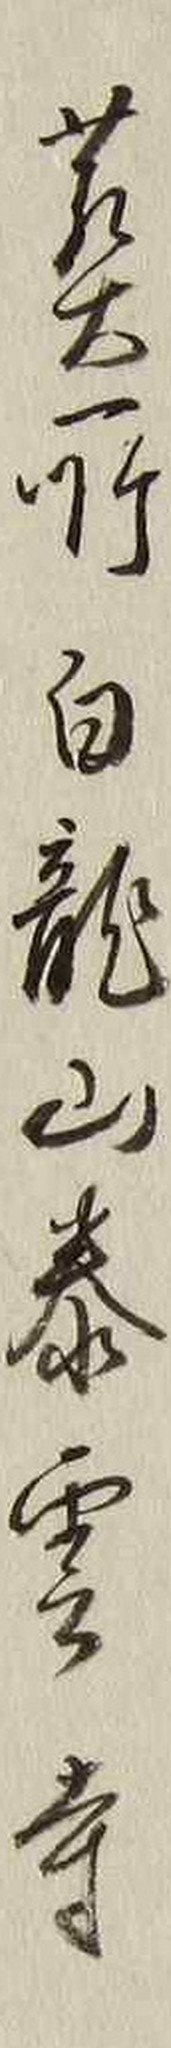葬所白竜山泰雲寺
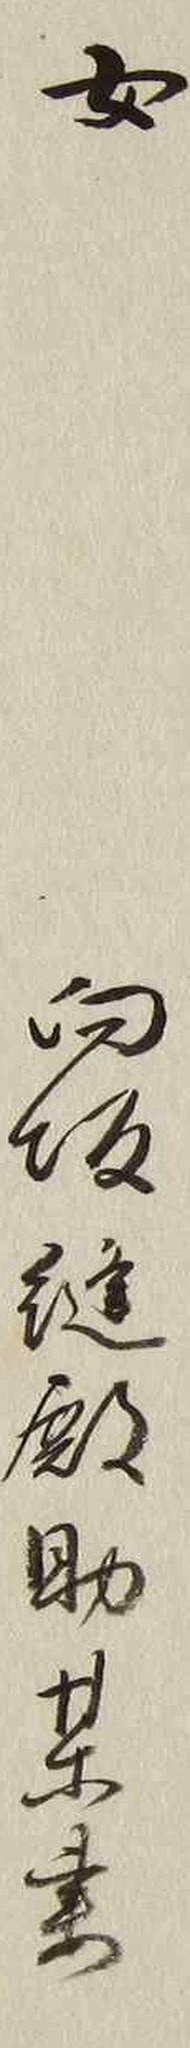女向坂縫殿助某妻
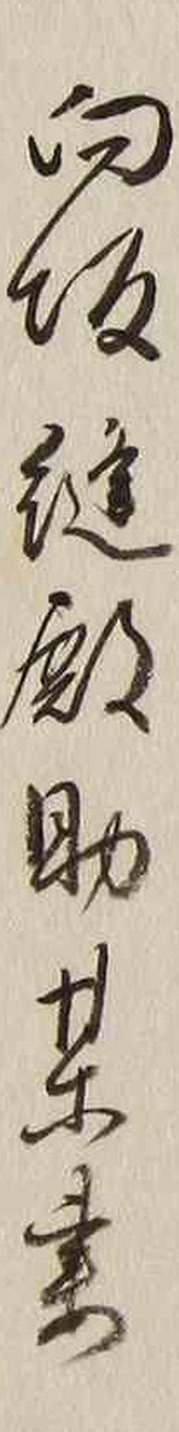女向坂縫殿助某妻
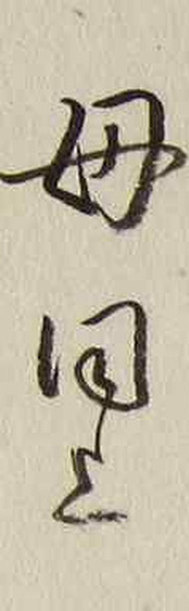母同上

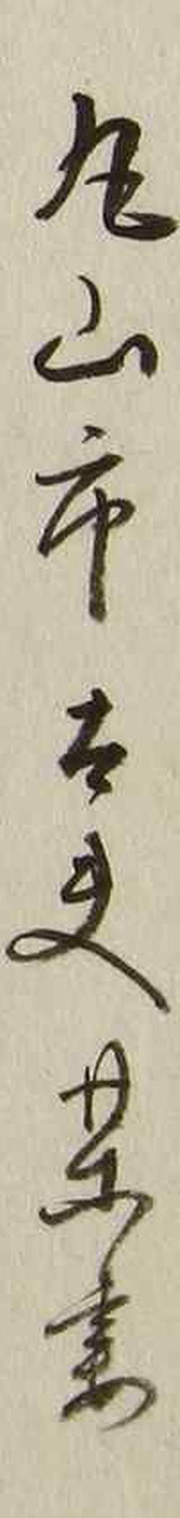女丸山市太夫某妻
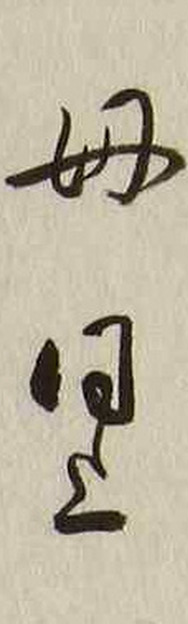母同上
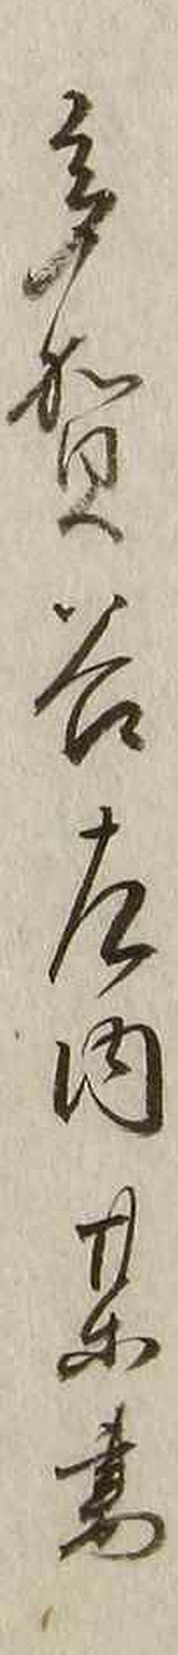女多賀谷左内某妻
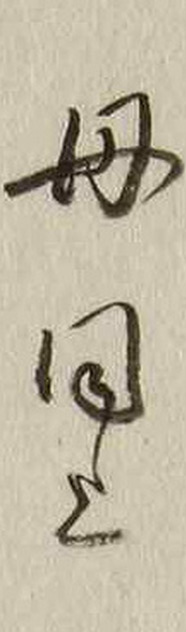母同上
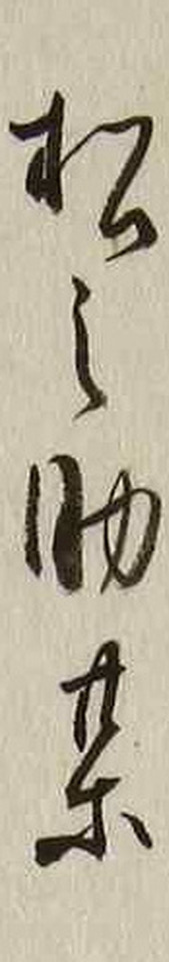松之助某
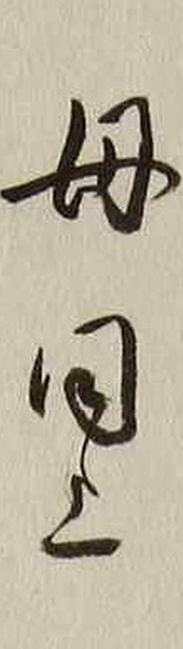母同上
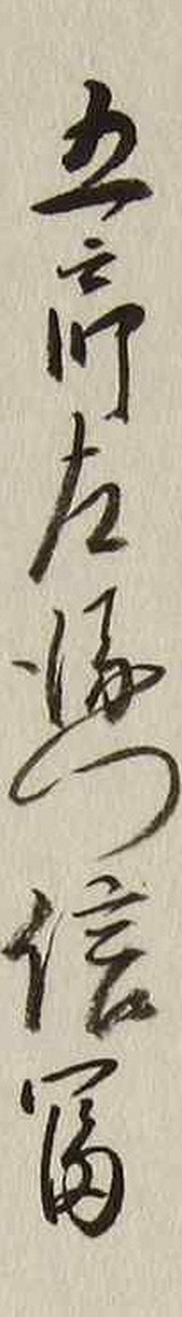五郎左後門信富
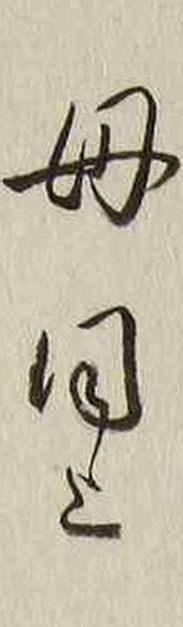母同上
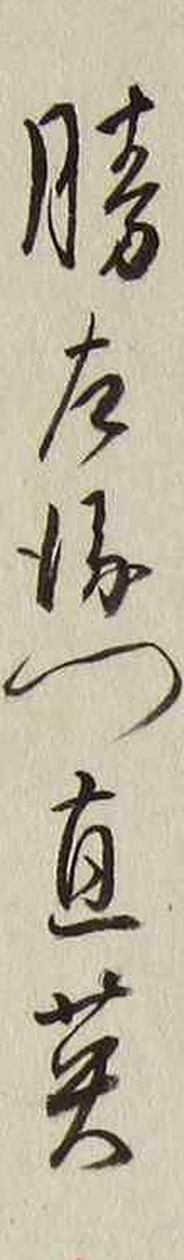勝左衛門直英
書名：諸士系譜　巻之159　な之部1
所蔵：会津若松市立会津図書館
